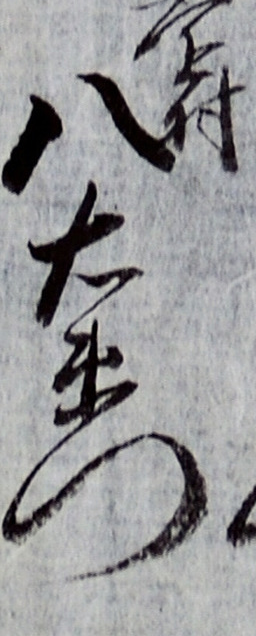八右衛門
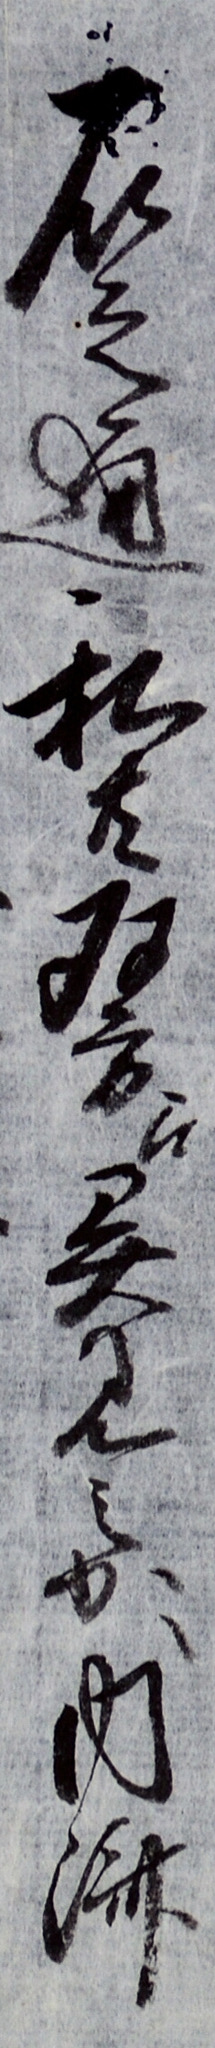右之通私共双方江異見之加へ内済
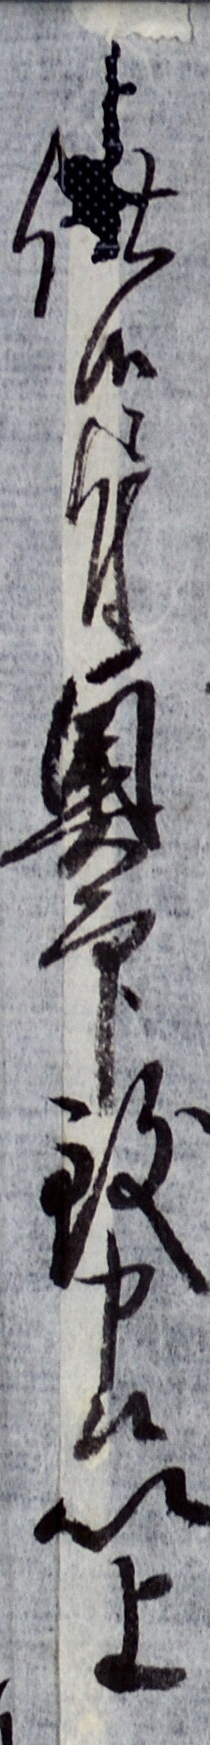仕候ニ付奥印致申候以上
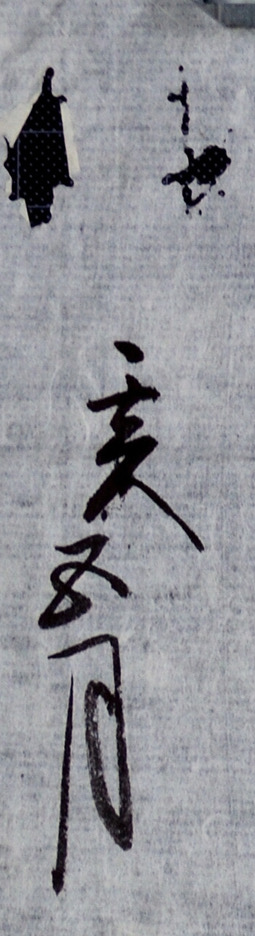亥五月
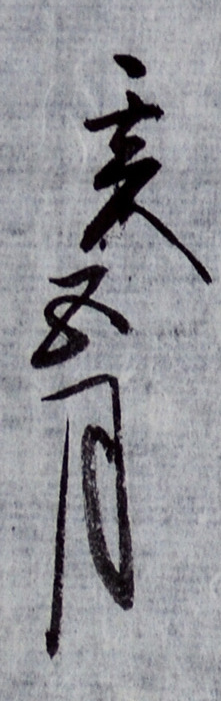亥五月
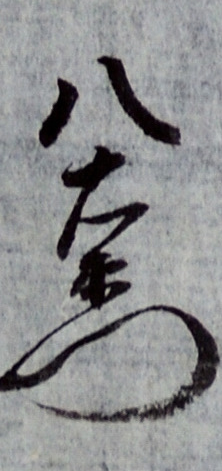八右衛門
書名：双方申合取替証文之事
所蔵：伊那市立高遠町図書館・合同会社AMANE
